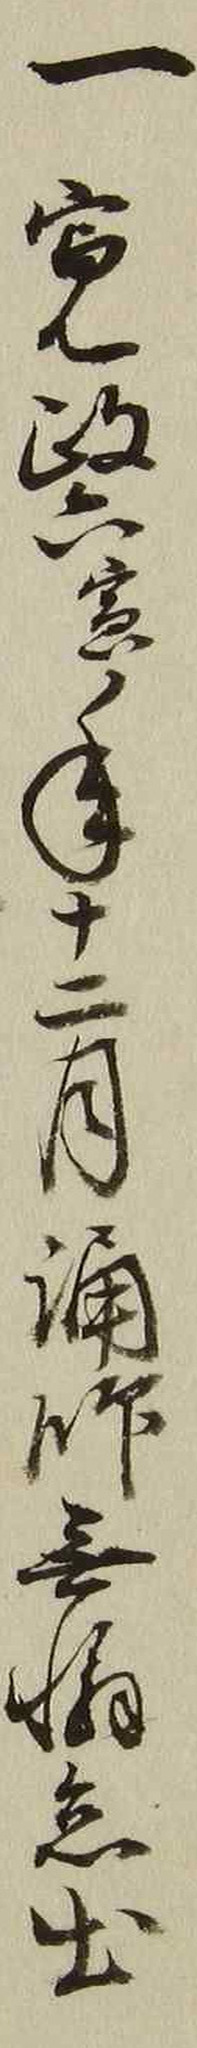一寛政六寅年十二月誦師無懈怠出
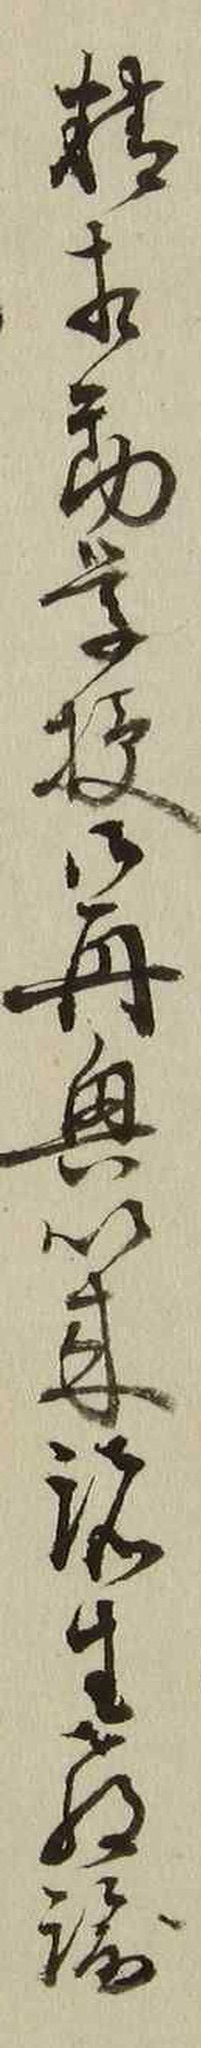精相勤学校御再興以来諸生教諭
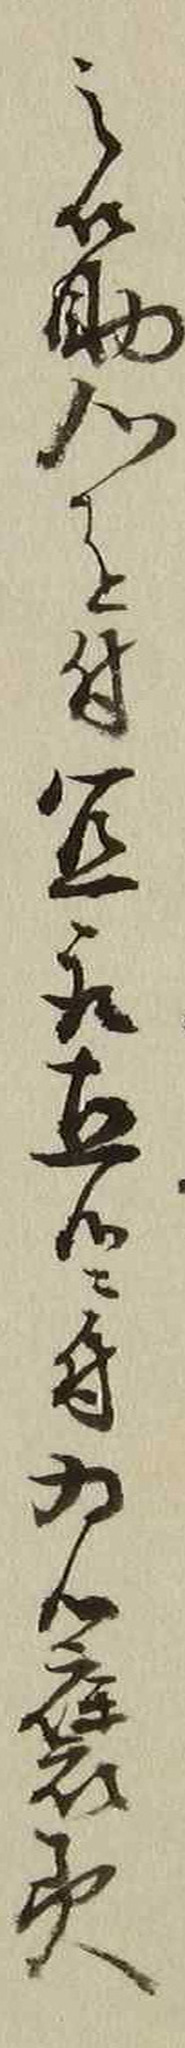之筋心を付宜取立候ニ付為御褒美
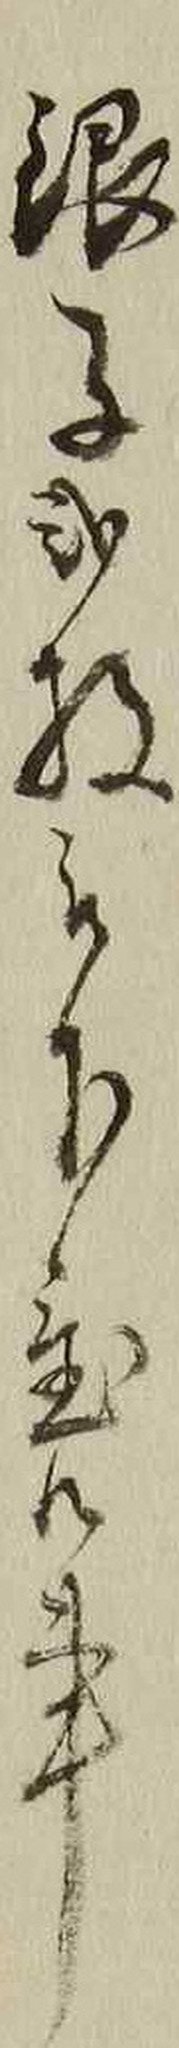銀子弐枚被下置候事
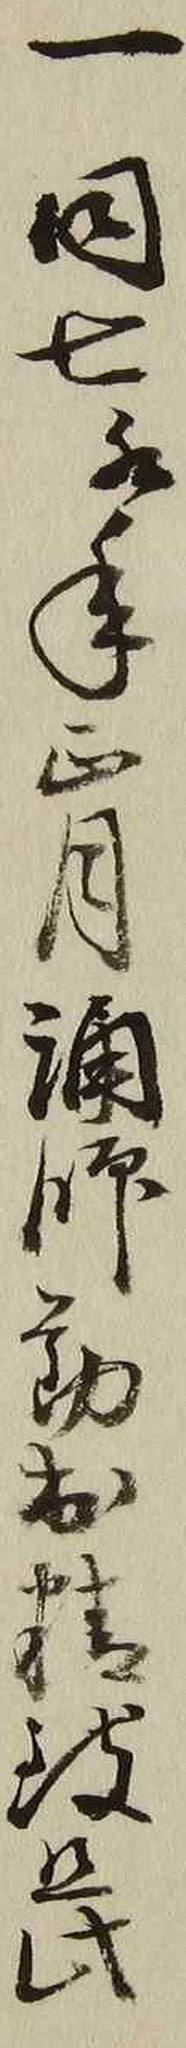一同七卯年正月誦師勤出精致且此
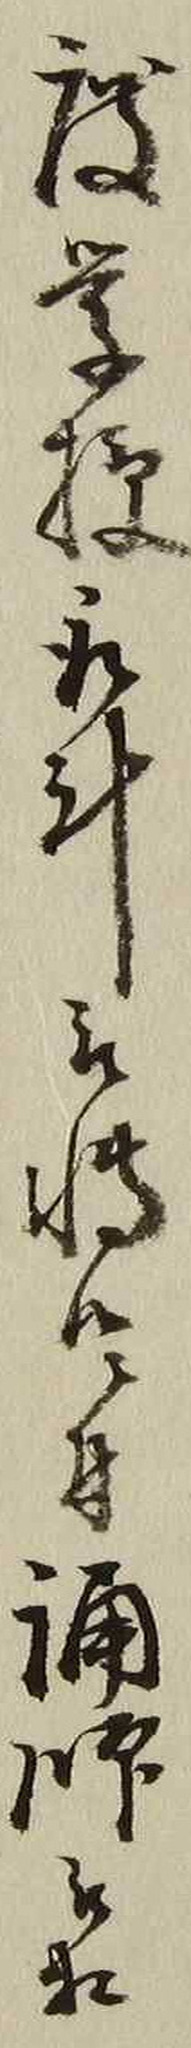度学校取計被転候ニ付誦師被相
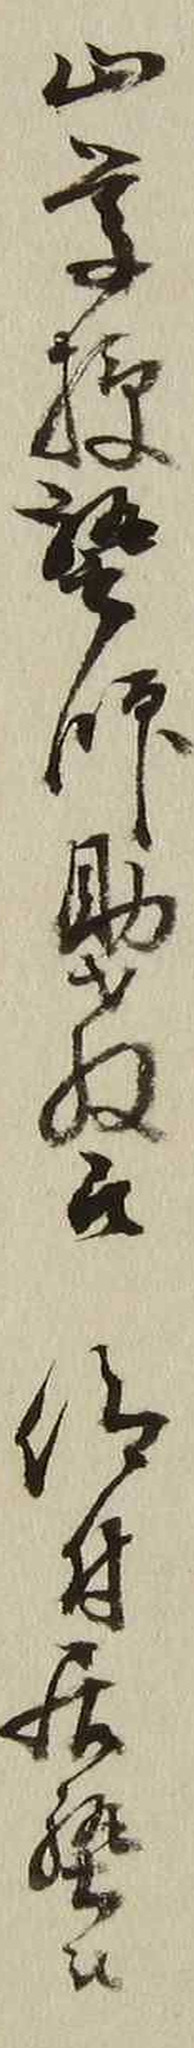止学校塾師助教被仰付居塾被
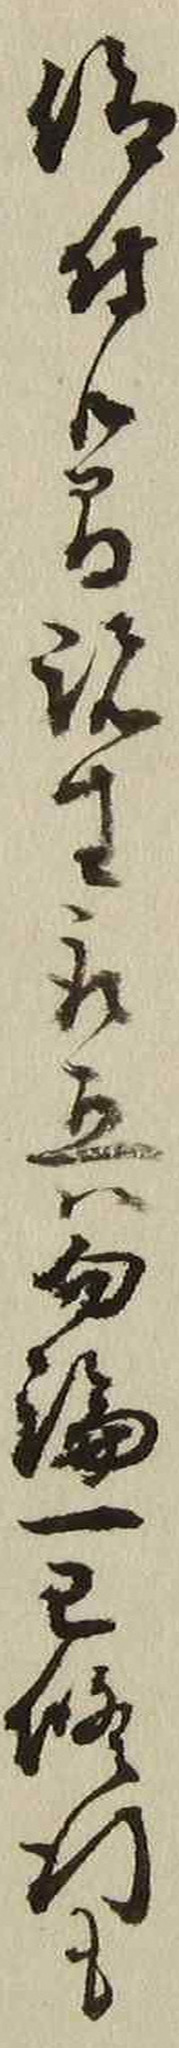仰付候間諸生取立ハ勿論一己修行も
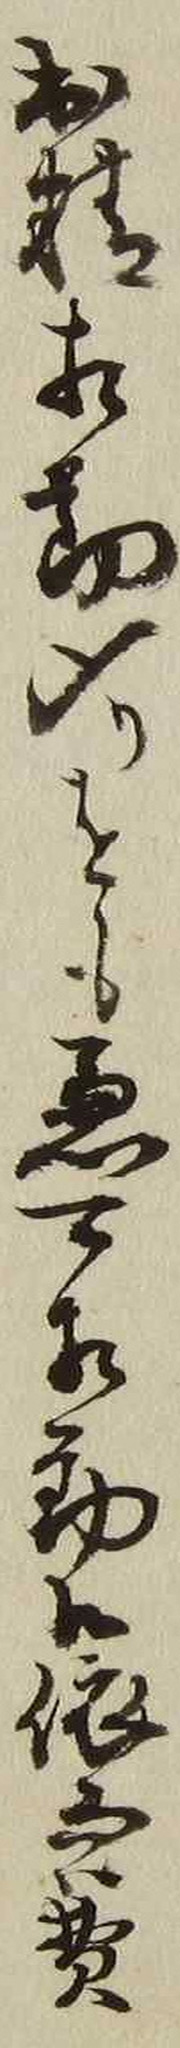出精相勤〆りをも兼可相勤候依而ハ費
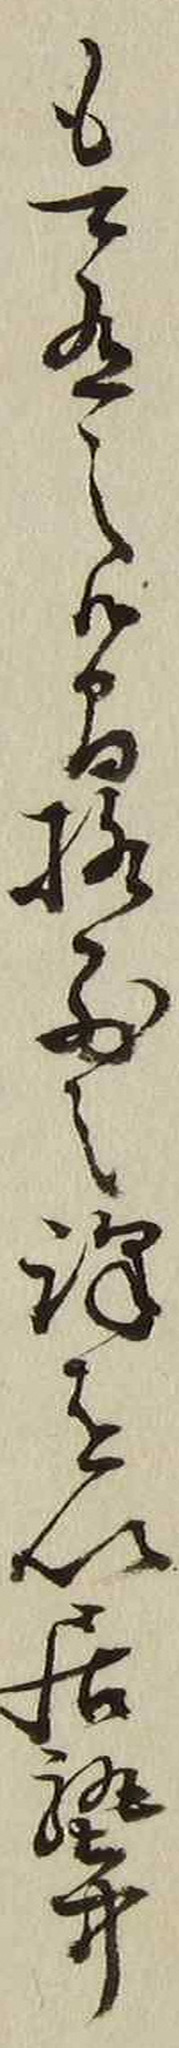も可有之候間格別之訳を以居塾中
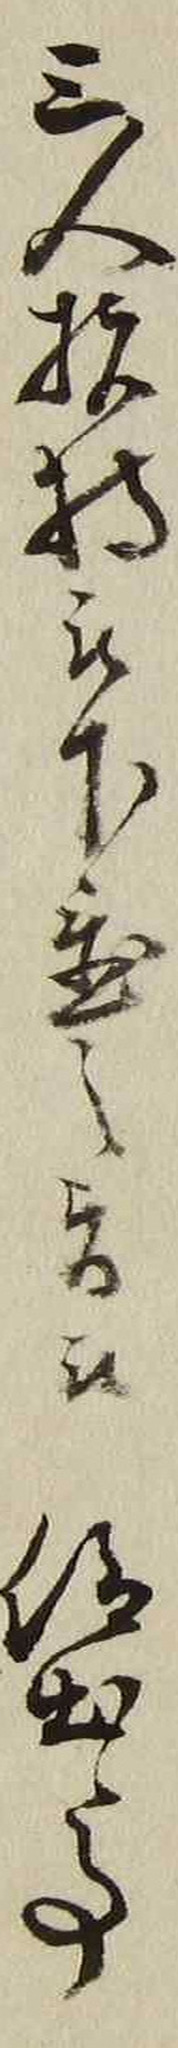三人扶持被下置之旨被仰出候事
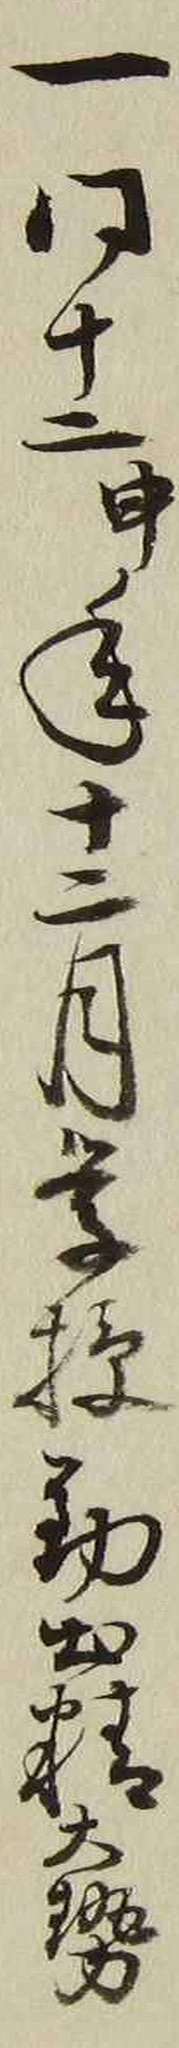一同十二申年十二月学校勤出精大勢
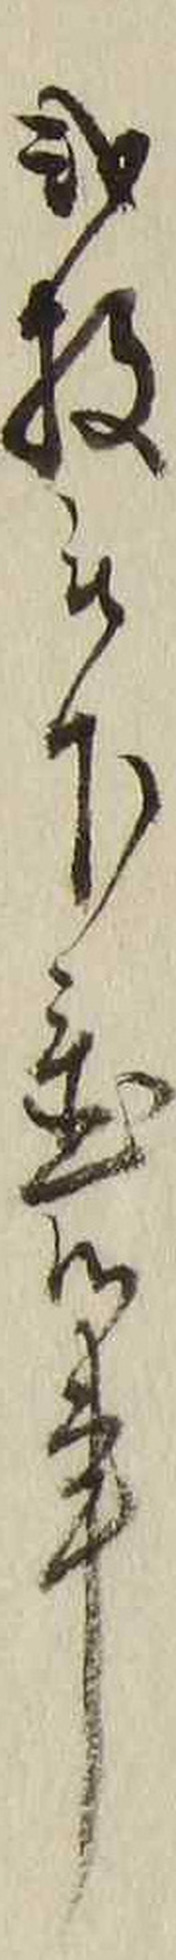弐枚被下置候事

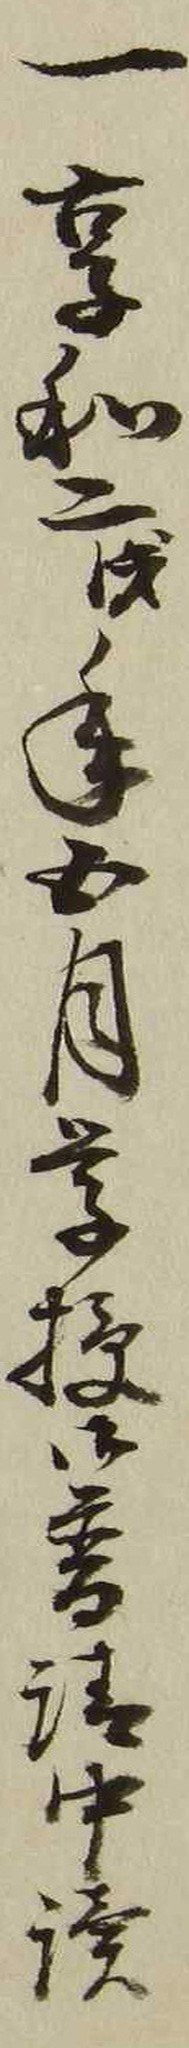一享和二戌年五月学校御普請中読
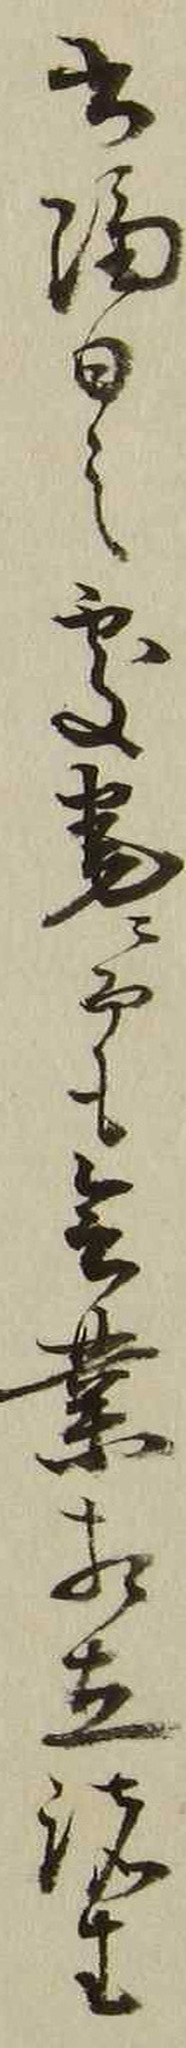書隔日之処毫ニ而も会業相立諸生
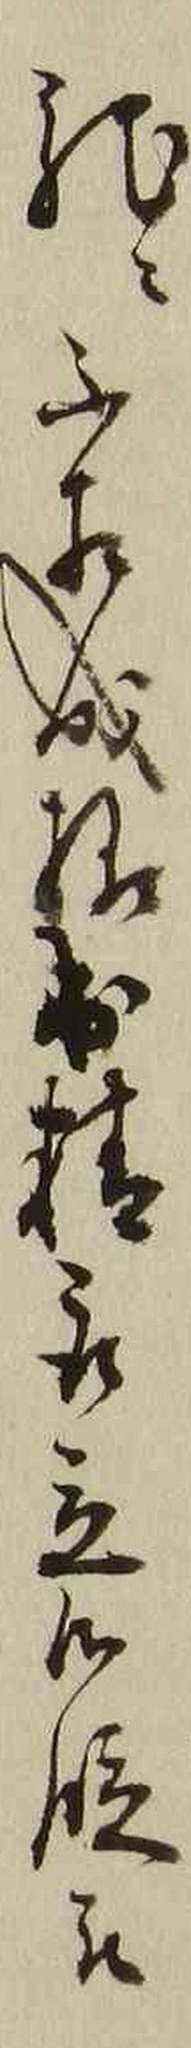馳ニ不相成様出精取立候段被
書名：諸士系譜　巻之36　は之部4
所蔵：会津若松市立会津図書館
